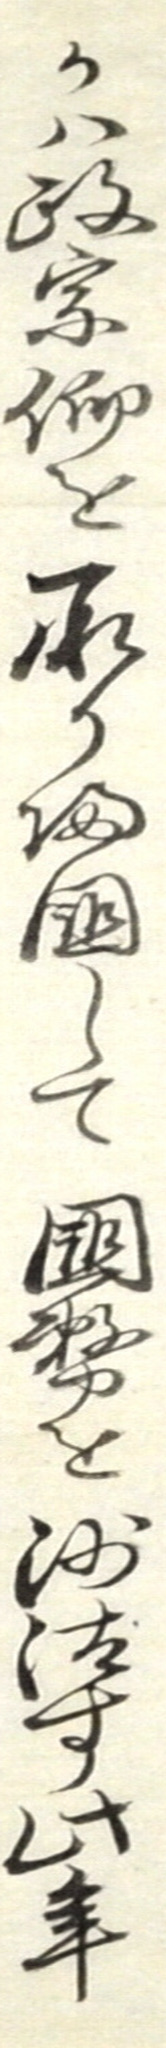かは政宗仰を承り帰国して国勢を沙汰す此年
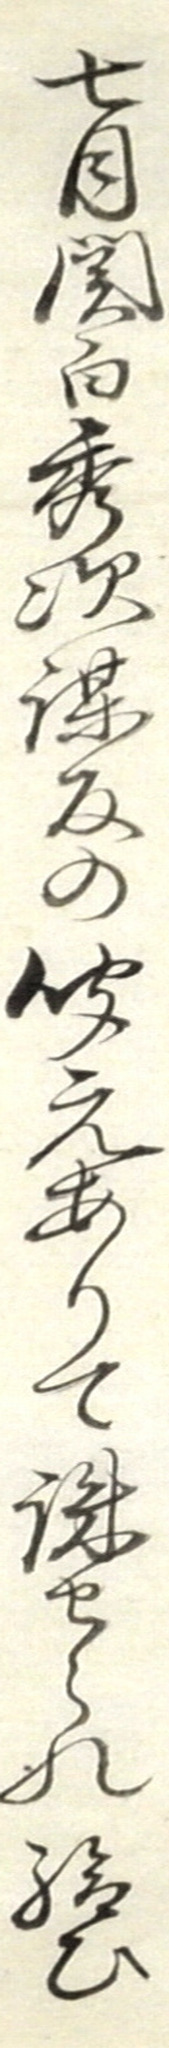七月関白秀次謀反の聞えありて誅せられ給ひ
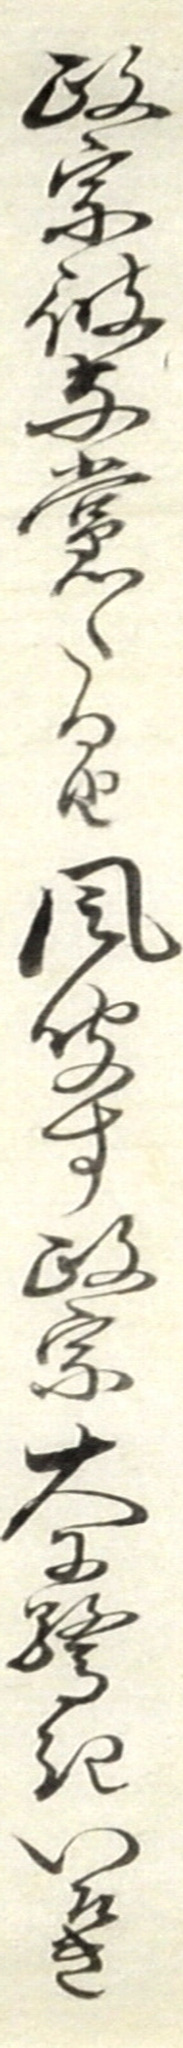政宗彼与党たる由風聞す政宗大に驚きいそき
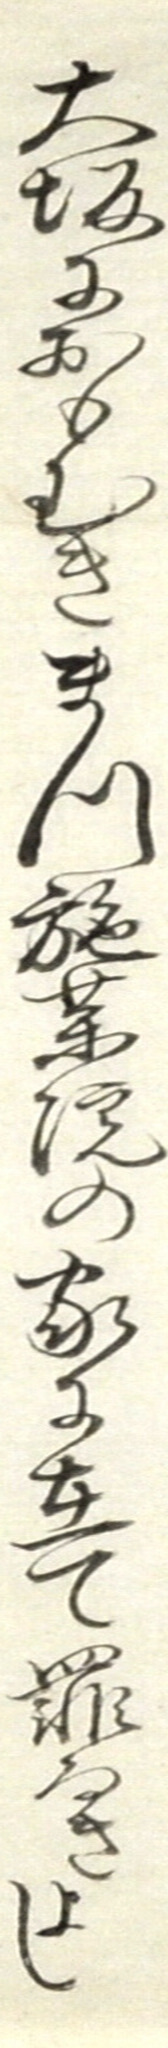大坂におもむきまつ施薬院の家に在て罪なきよし
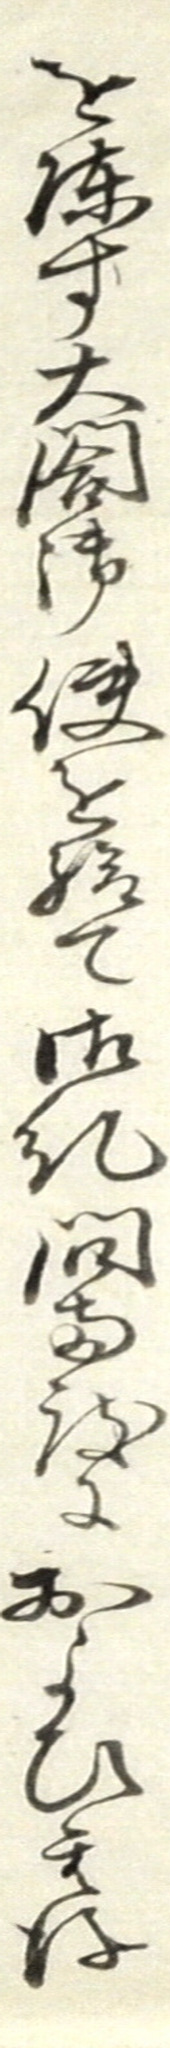を陳す太閤御使を給て御糺問両度におよひ其後
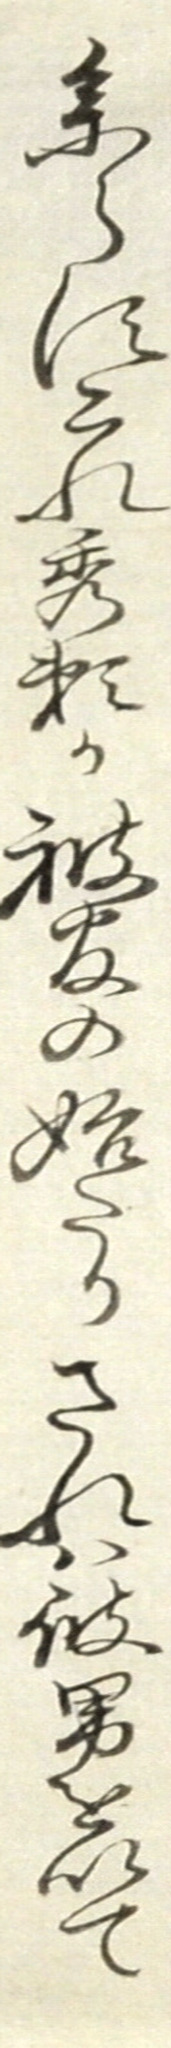参らすこれ秀頼か被官の始たりされは彼男を以て
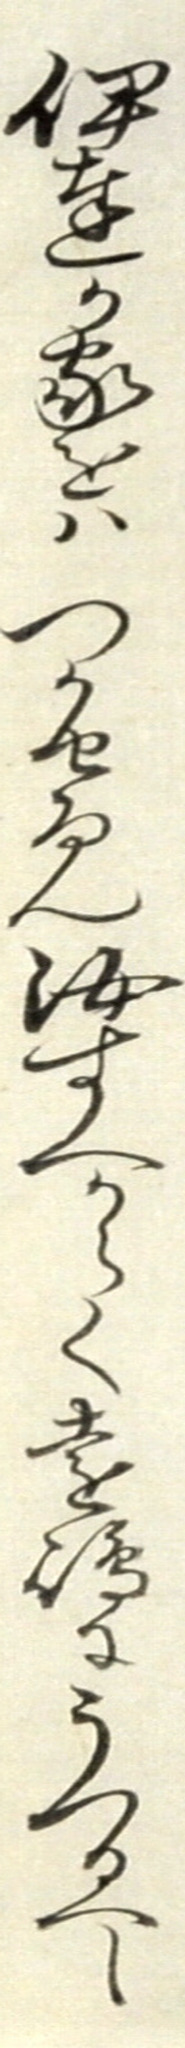伊達か家をはつかせなん汝すへからく遠島にうつるへし
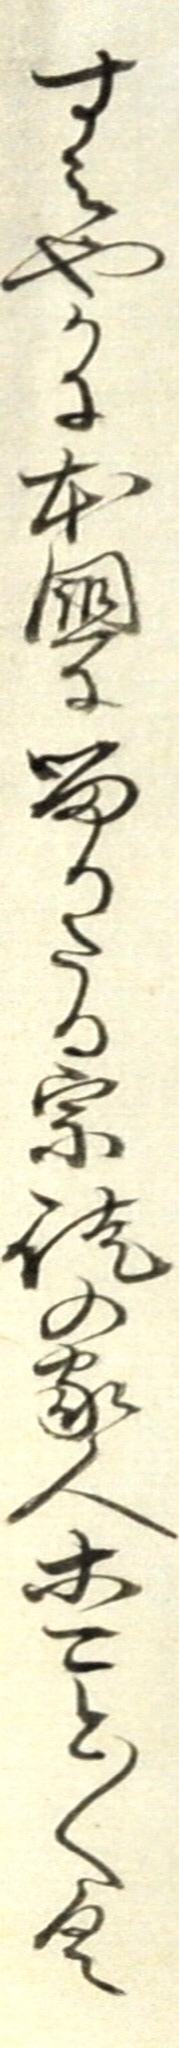すみやかに本国に留りたる宗徒の家人等こと〳〵く

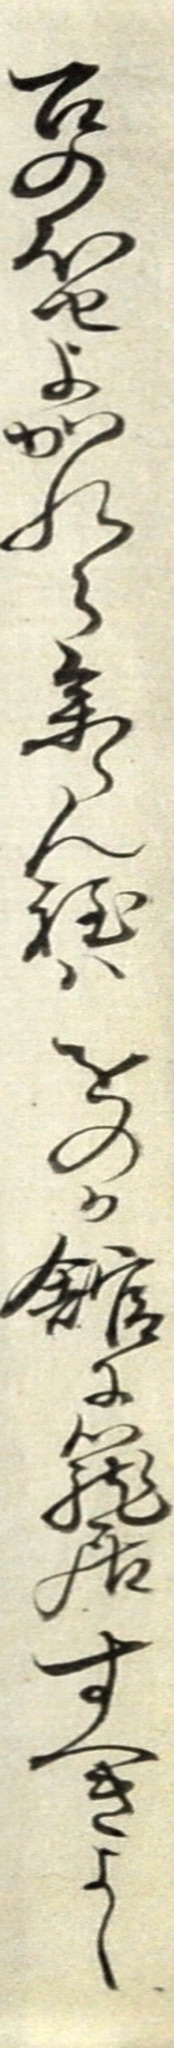召のほせよかれら参らん程はをのか館に籠居すへきよし
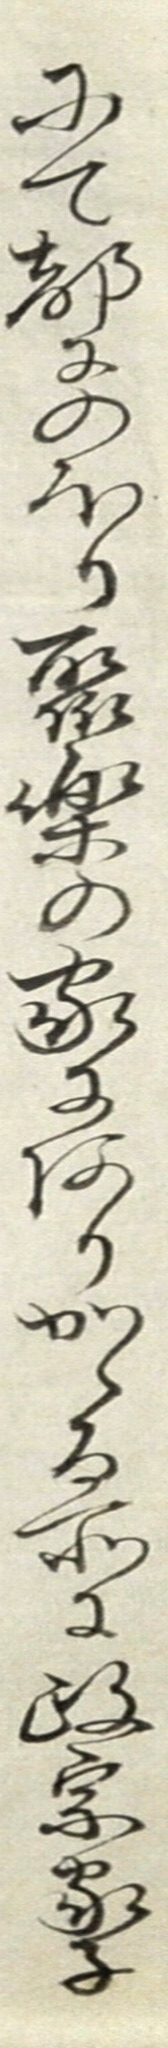にて都にのほり聚楽の家にありかゝる所に政宗御家子
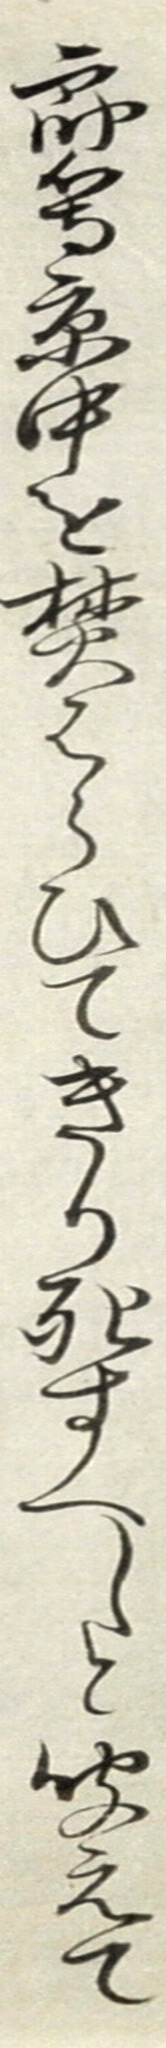郎等京中を焚はらひてきり死すへしと聞えて
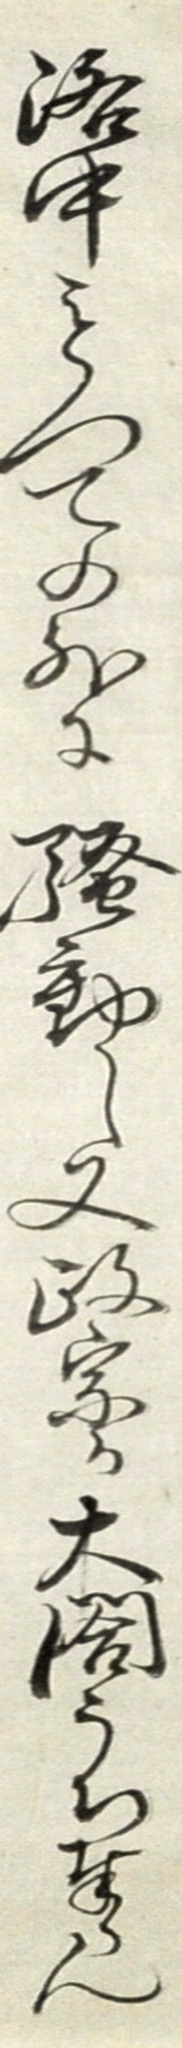洛中もつての外に騒動し又政宗か太閤うち奉らん
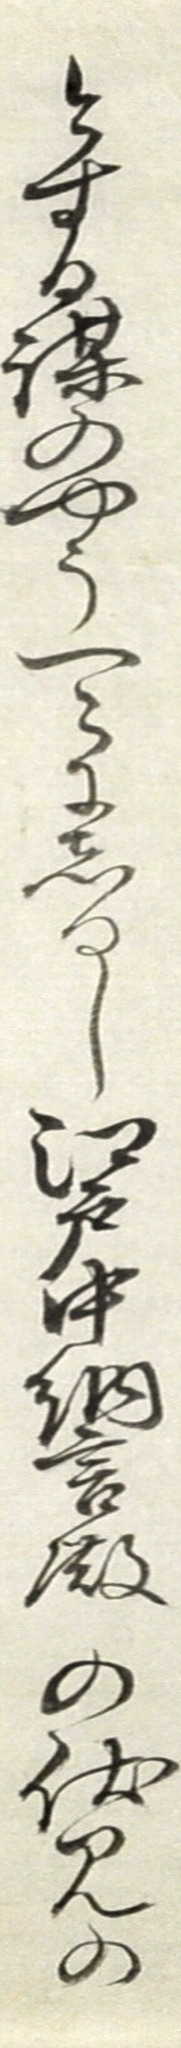とする謀のやうへらにしるし江戸中納言殿の伏見の
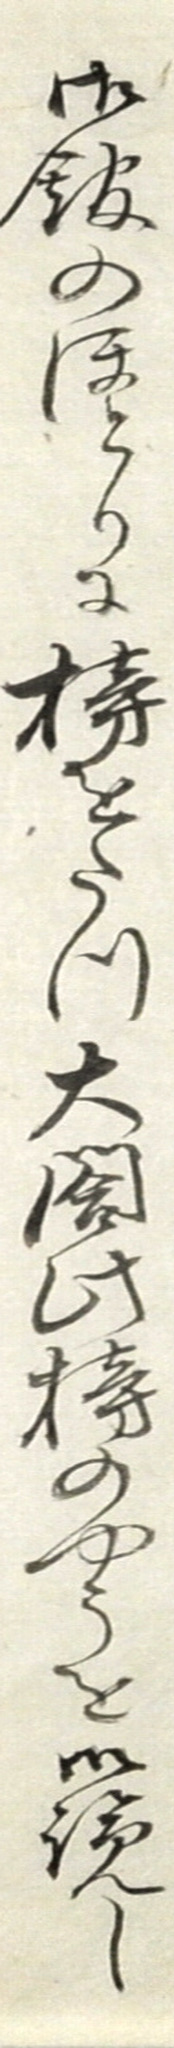御館のほとりに榜をたつ太閤此榜のやうを御覧し
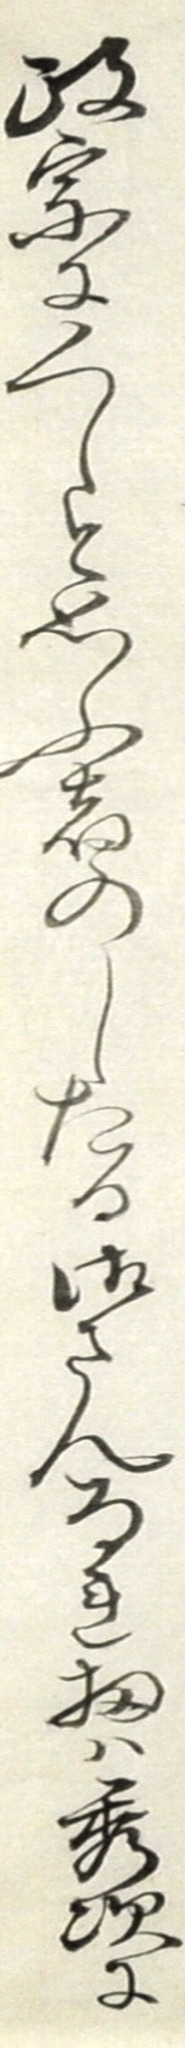政宗にくしと思ふ者のしたる御さんなれ扨は秀次に
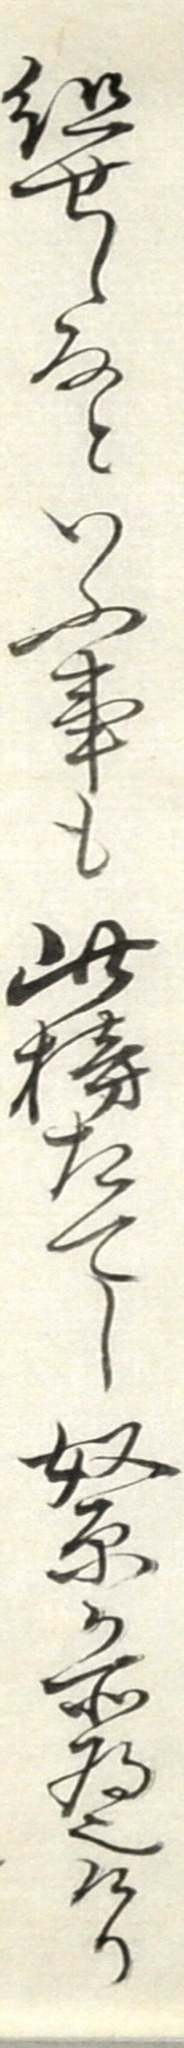組せしなといふ事も此榜たてし奴原か所為也けり
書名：藩翰譜（七・下）
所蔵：伊那市立高遠町図書館・合同会社AMANE
